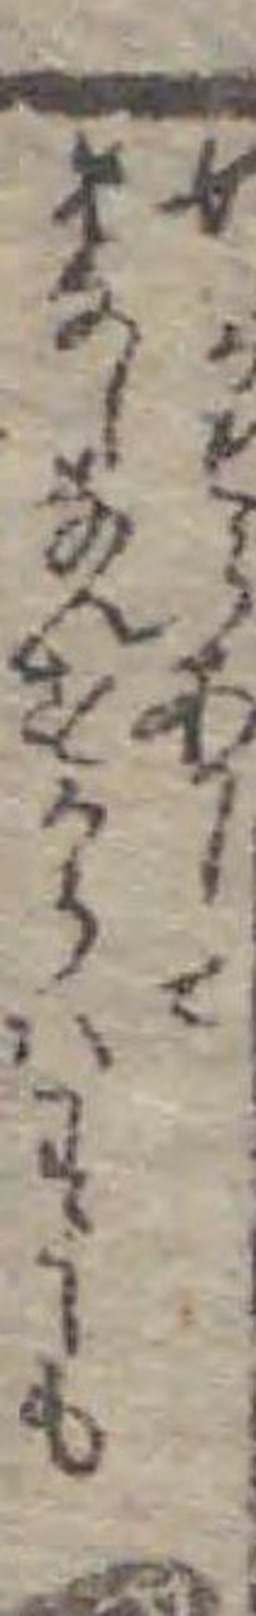はなしなんすからはわたしも
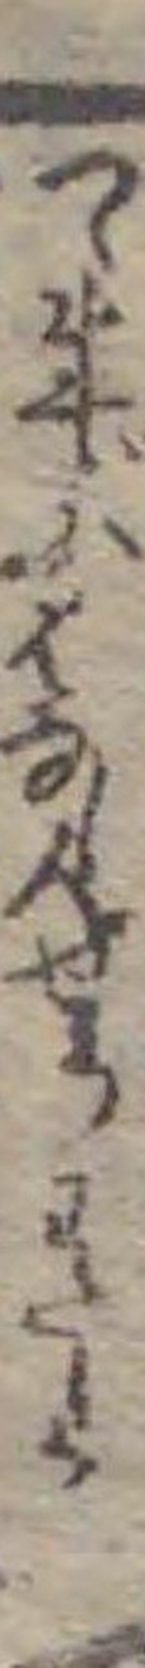つつまずにはなしんせうわたしか
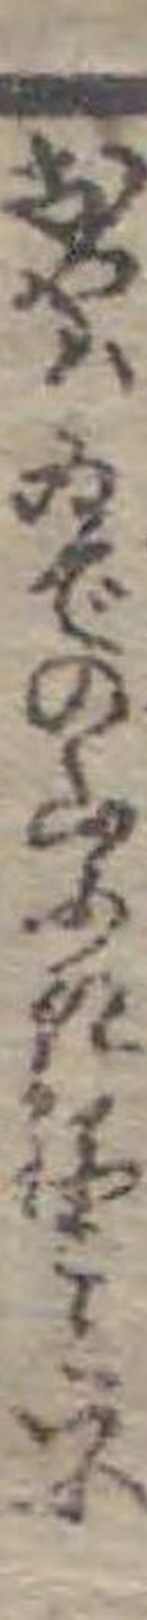おやはゐでの山に化ねこといふ
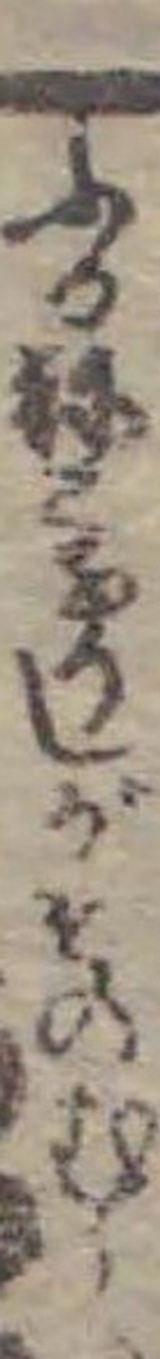ふるねこなりしがそのむ
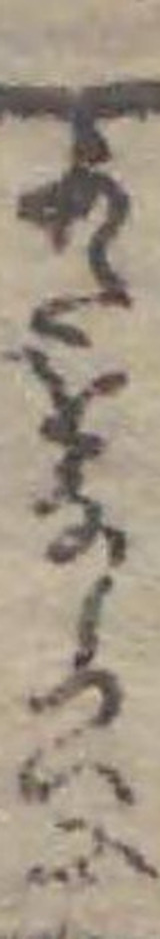あたをなしついに
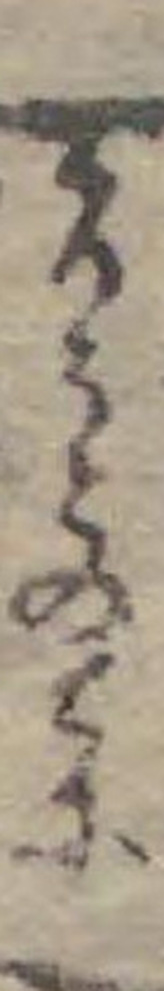かりうとのてに
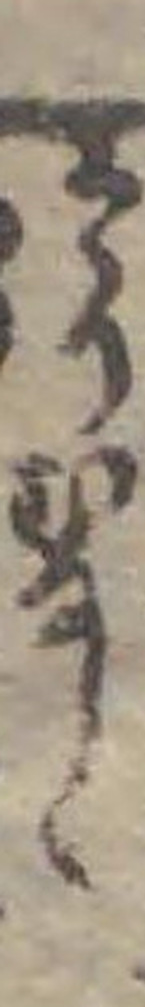かゝりむなしく
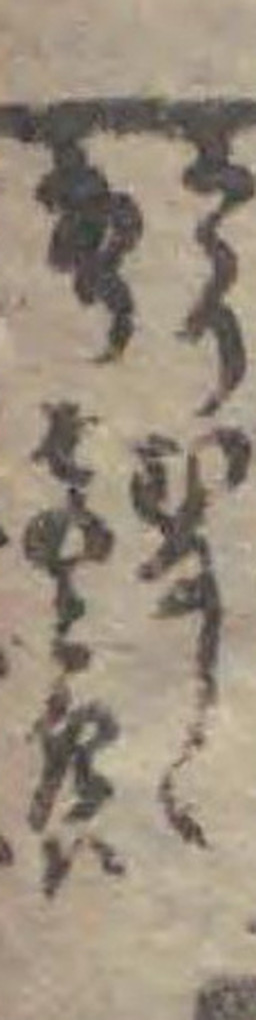なりそのときは
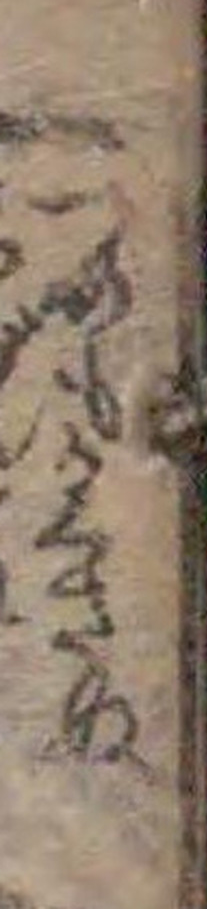つめもかくさぬ
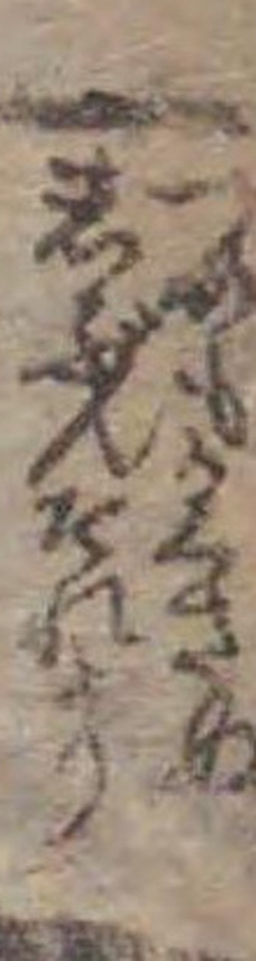しぶんそれより
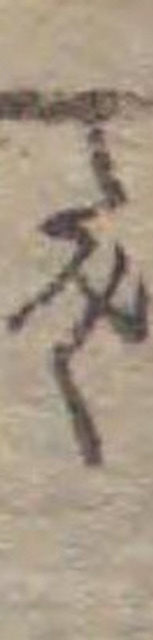たん〳〵
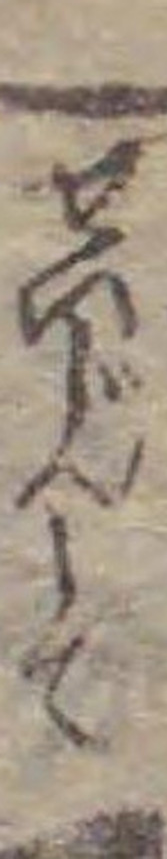せいじんして
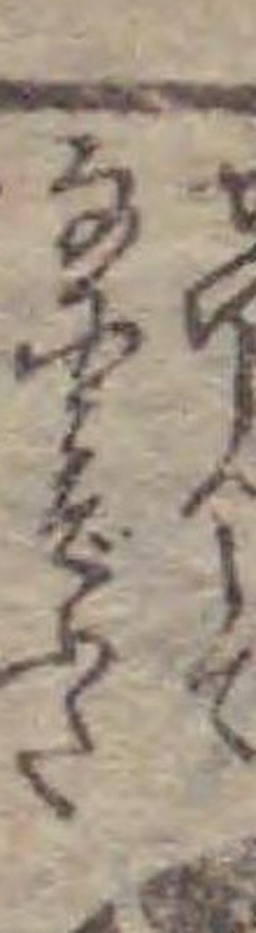なにとぞふた
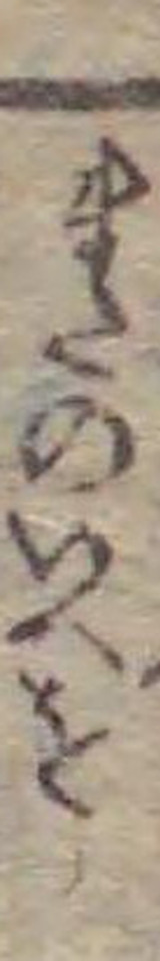またのいへを
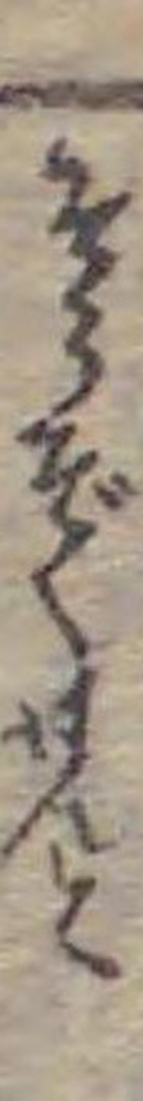そうぞくせんと
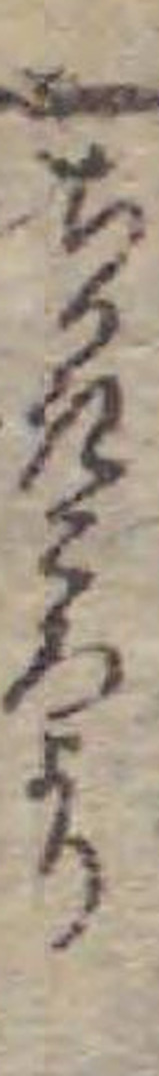ちかきころより
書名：[化物一代記] : 5巻
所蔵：国立国会図書館 National Diet Library, JAPAN
